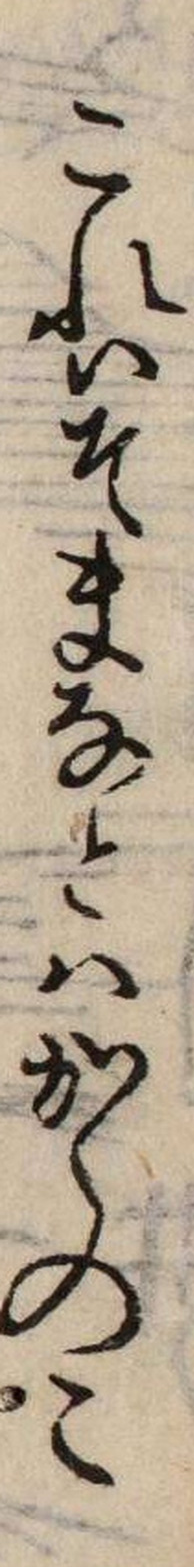これはそまなとはかくのこ
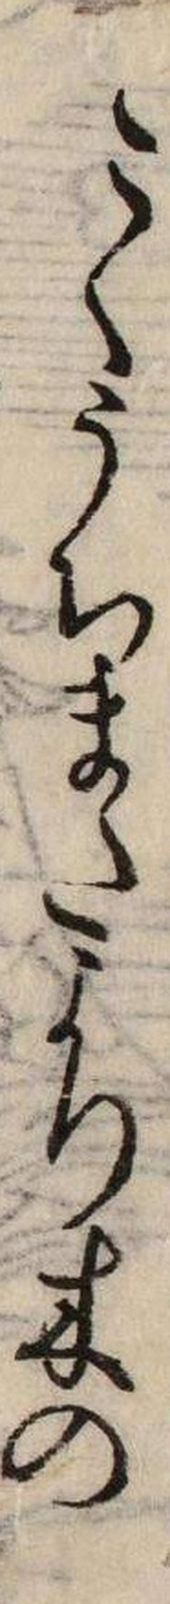こくうちまたより木の
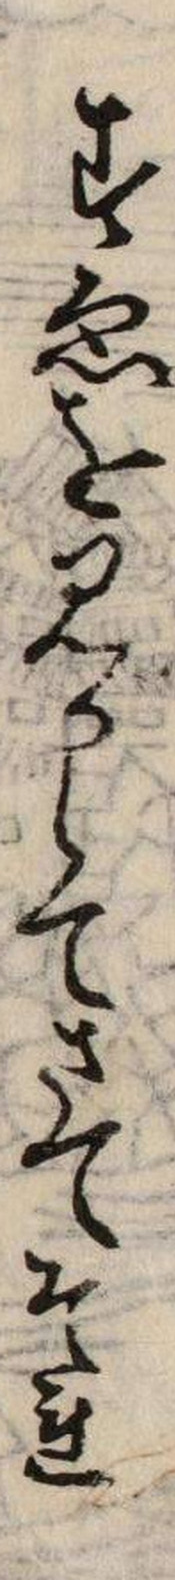すゑを見るしてさてそれ
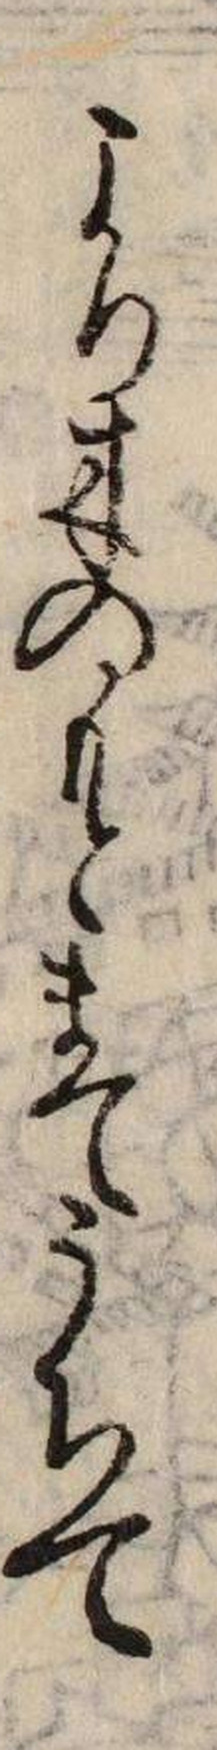より木のもとまてうちて
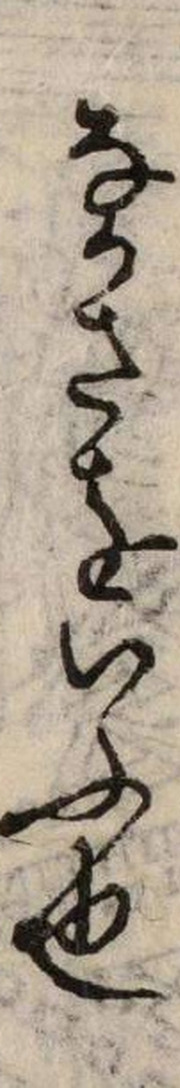なかさをいふ也
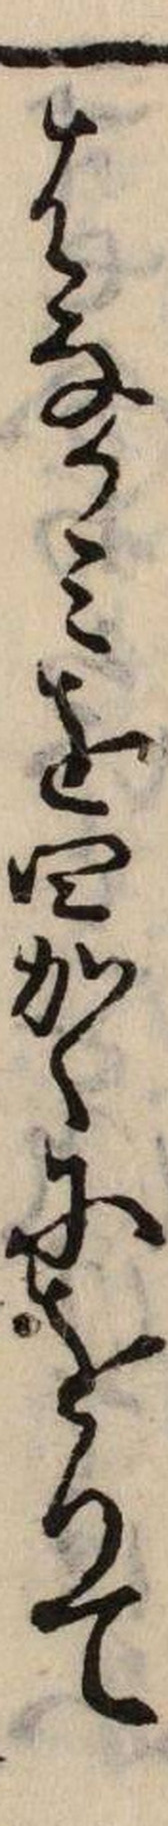はなかみを四かくにをりて
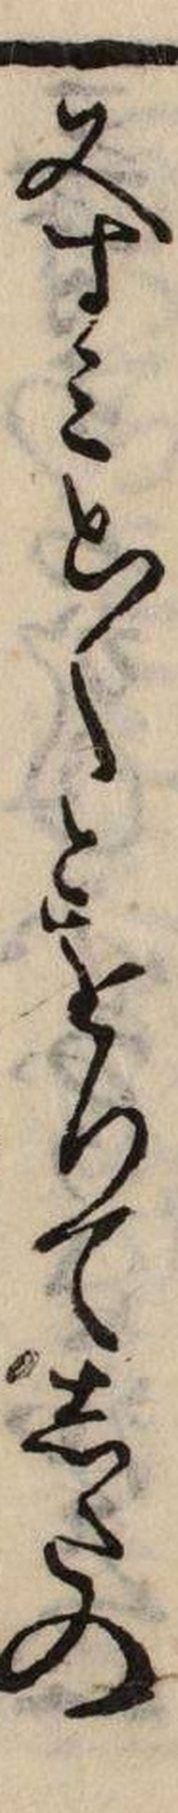又すみとくとをりてしたの
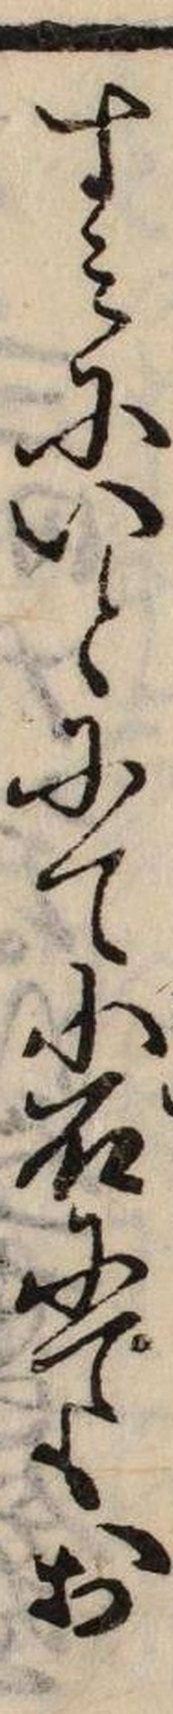すみにいとにて小石にてもお
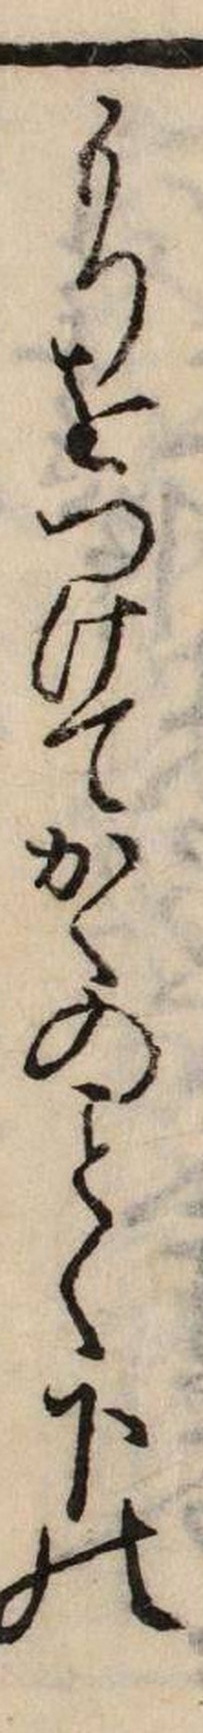もりをつけてかくのことく下の
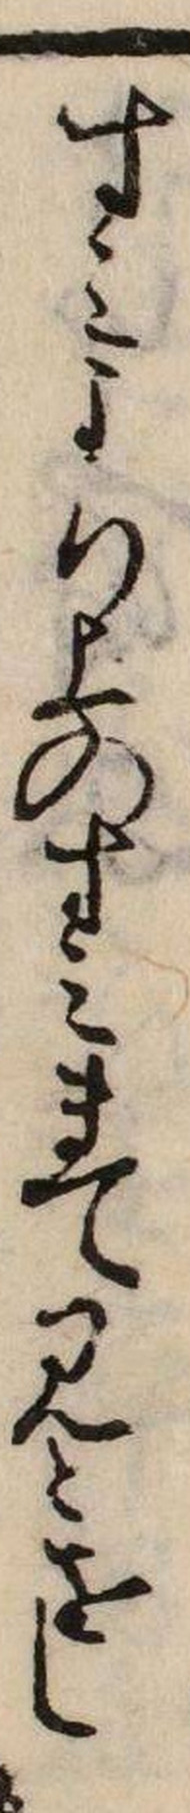すみより上のすみまて見とをし
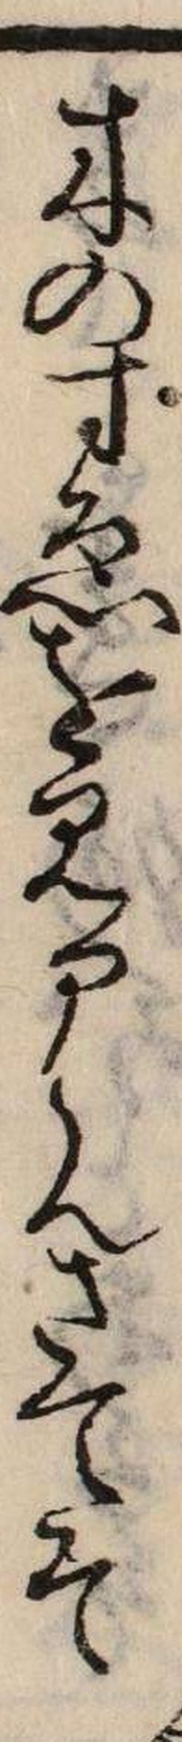木のすゑを見るしんさてそ
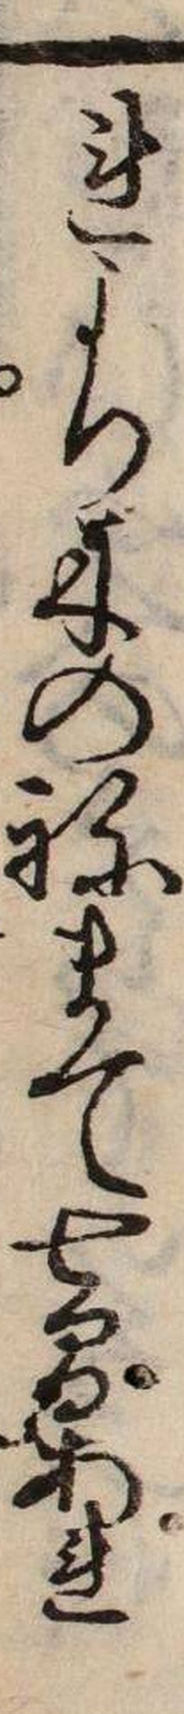れより木のねまて七間あれ
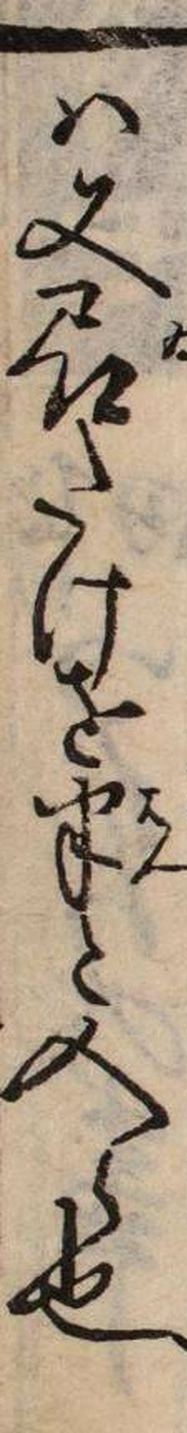は又居たけを半と入ら也

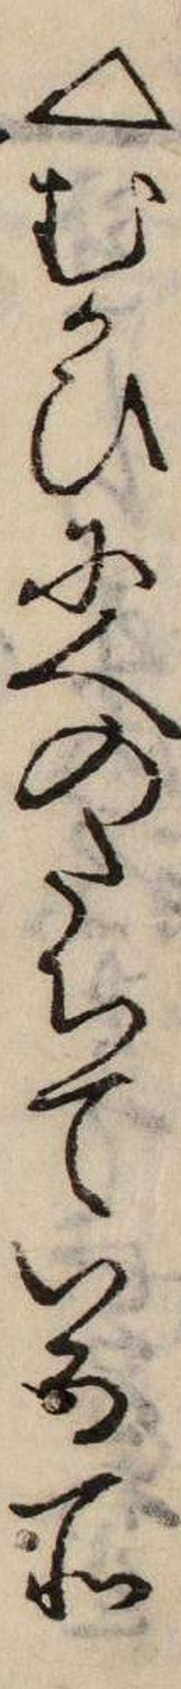△むかひに人のたちている所
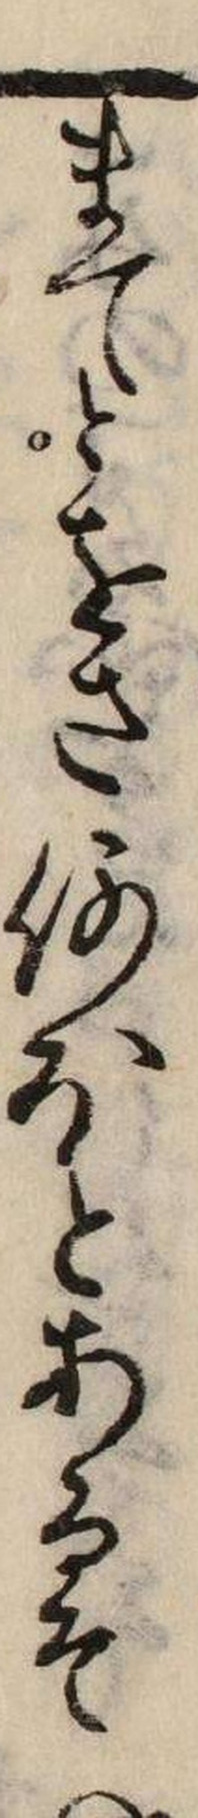まてとをさ何ほとあるそ
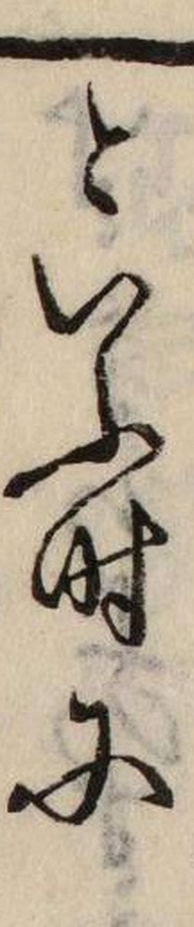といふ時に
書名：塵劫記（寛永11年自跋、京都府立京都学・歴彩館追貴8）
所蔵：京都府立京都学・歴彩館 国文学研究資料館
